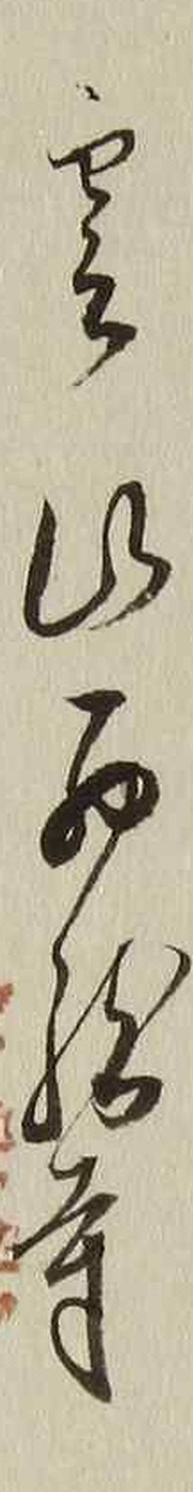雲山西勝寺
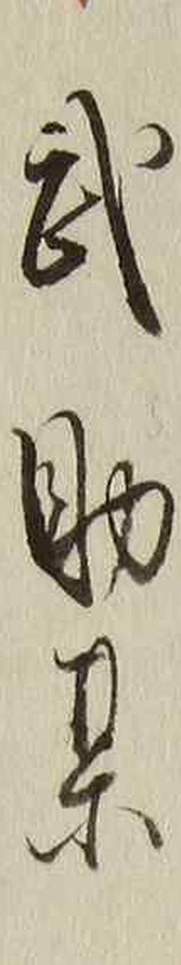武助某
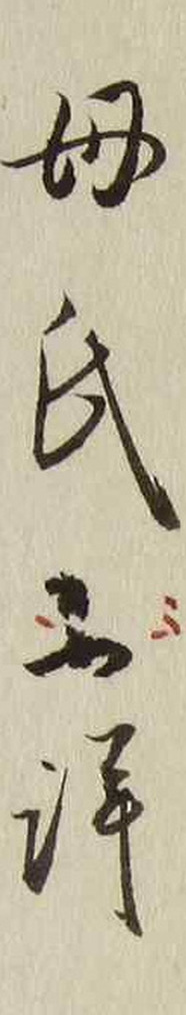母氏不詳
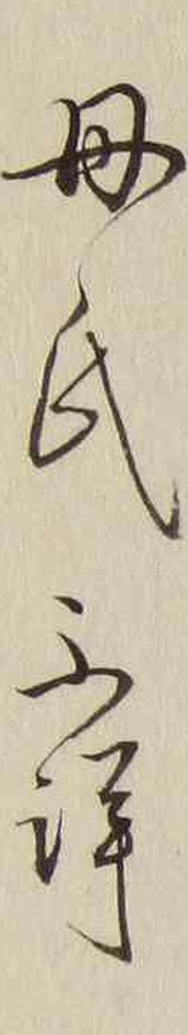母氏不詳

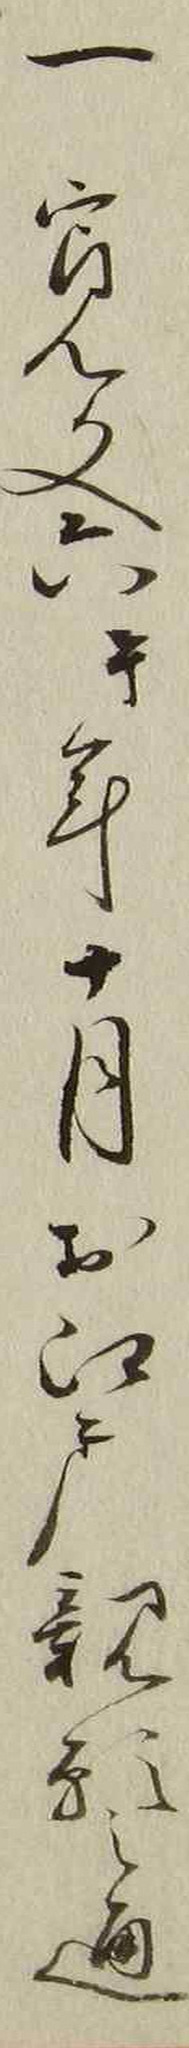一寛文六午年十月於江戸親願之通
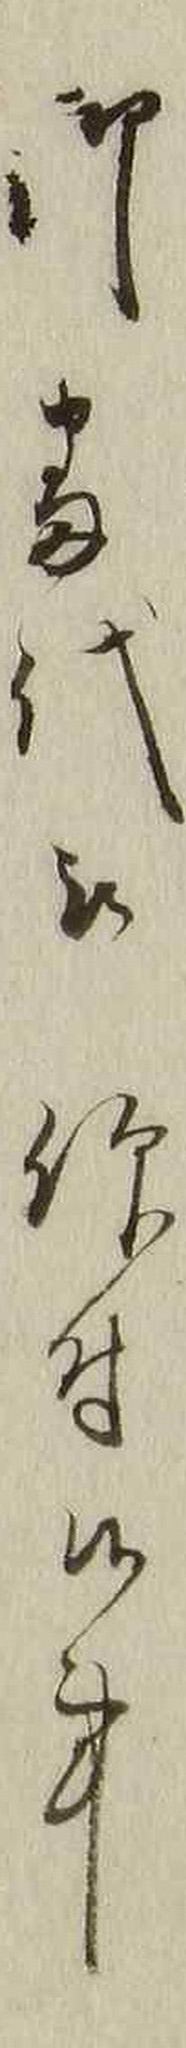御番代被仰付候事
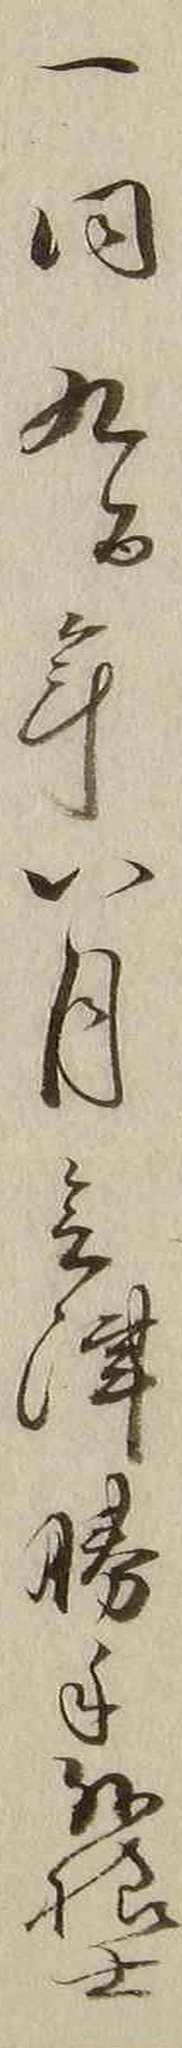一同九酉年八月会津勝手外様士
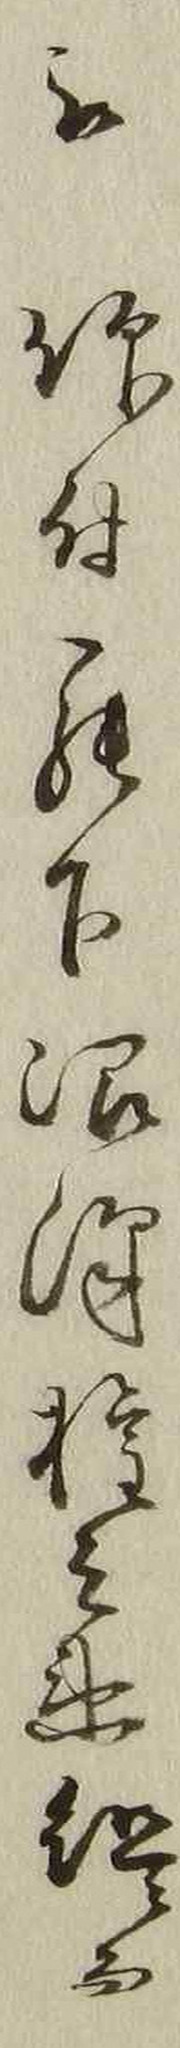被仰付罷下沼澤権兵衛組ニ而
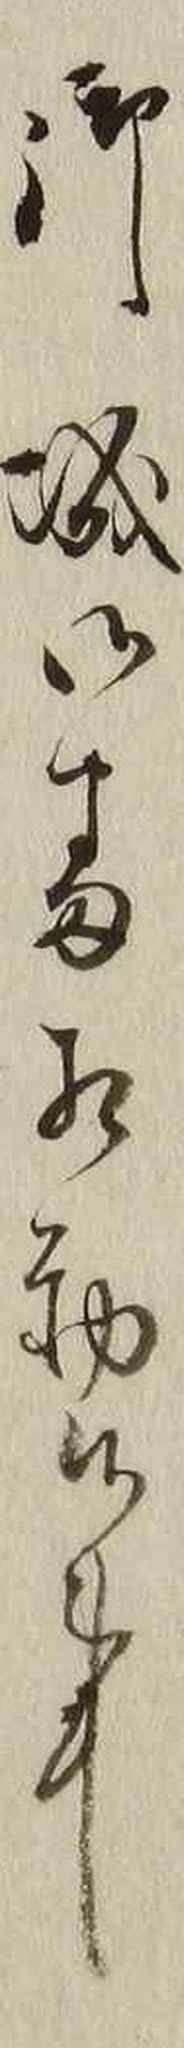御城御番相勤候事
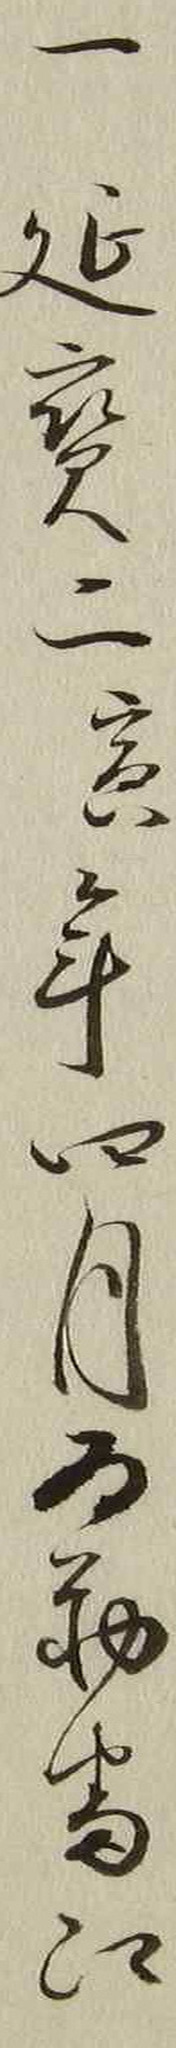一延宝二寅年四月為勤番江
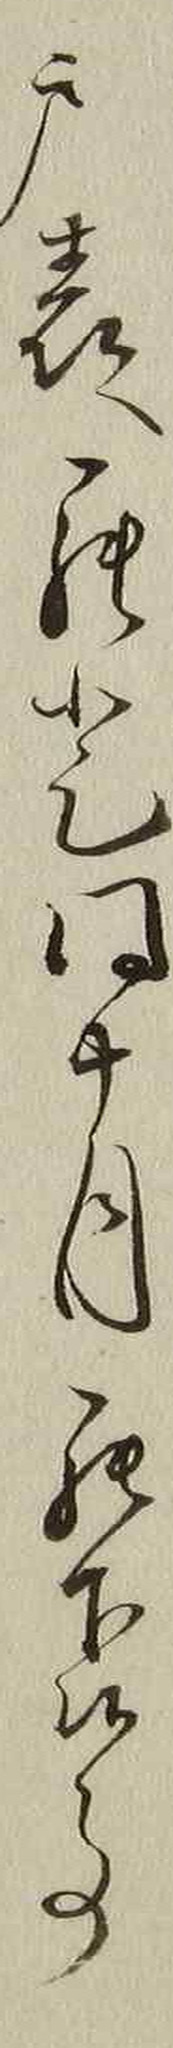戸表へ罷登同十月罷下候事
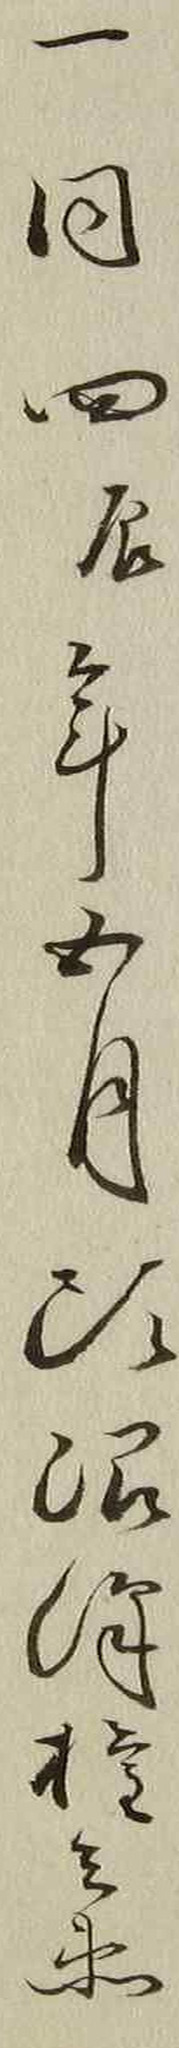一同四辰年五月頭沼澤権兵衛
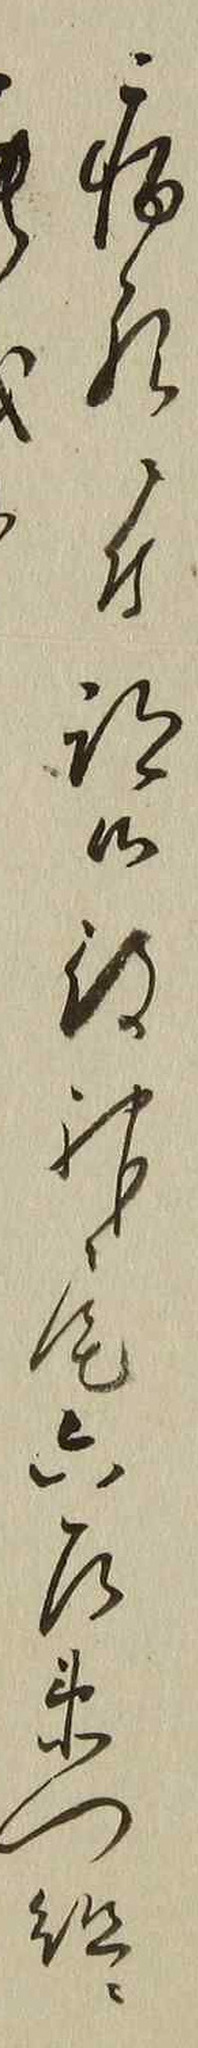病死ニ付跡御役神尾六左衛門組ニ
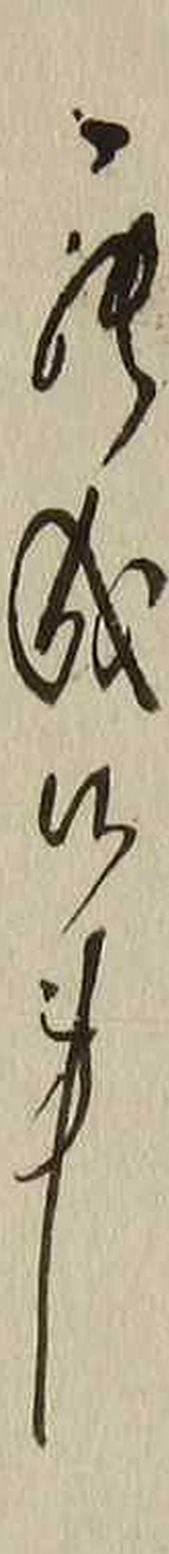罷成候事
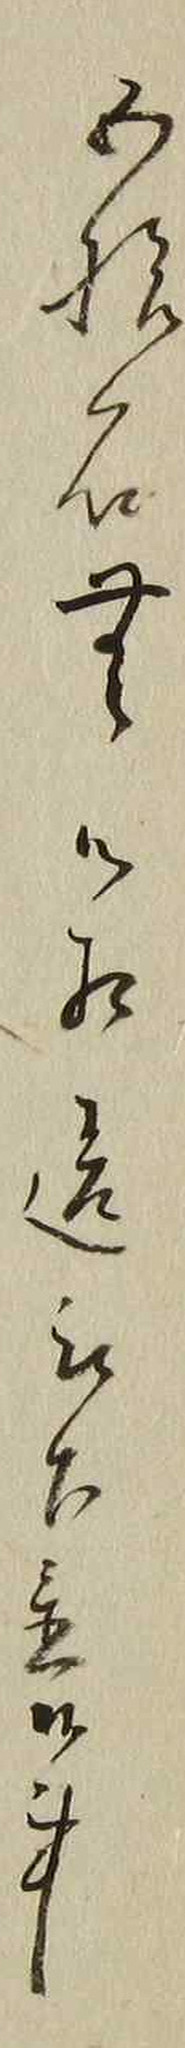五拾石無御相違被下置候事
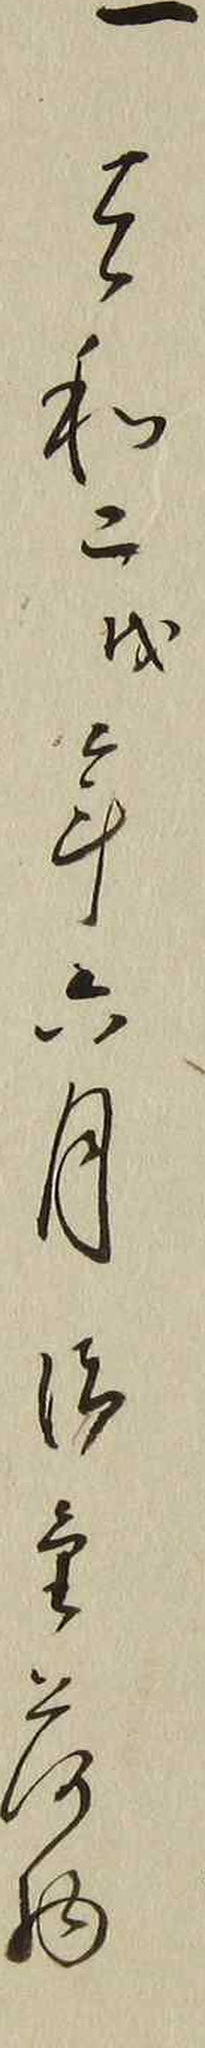一天和二戌年六月御金荷物
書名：諸士系譜　巻之129　た之部5
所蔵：会津若松市立会津図書館
